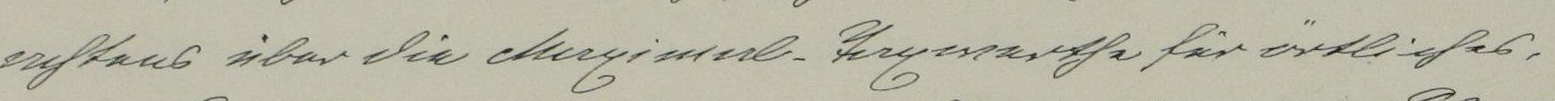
achtens über die Maximal-Taxwerthe für örtliches,
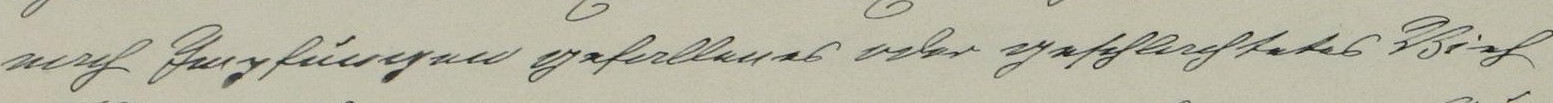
nach Impfungen gefallenes oder geschlachtetes Vieh
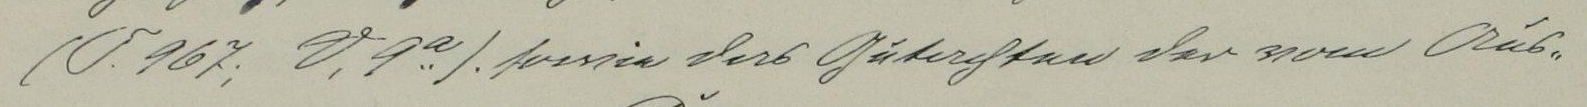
(T.967; V.9a). sowie das Gutachten der vom Aus-
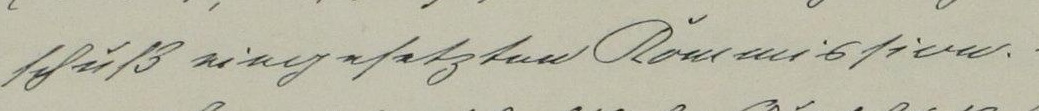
schuß eingesetzten Kommission.
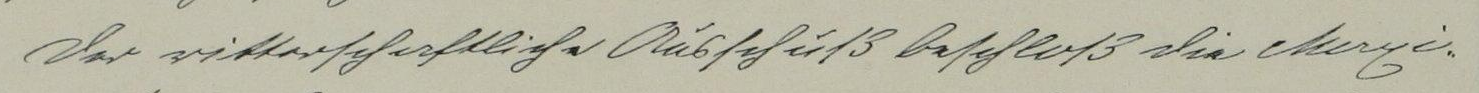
Der ritterschaftliche Ausschuß beschloß die Maxi-
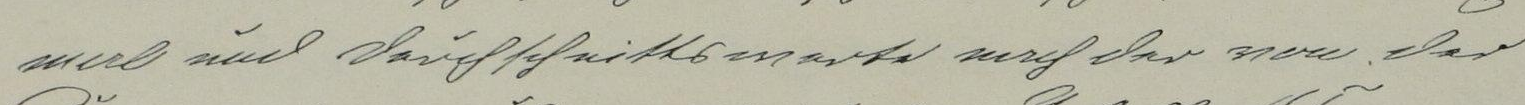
mal und Durchschnittswerte nach der von der
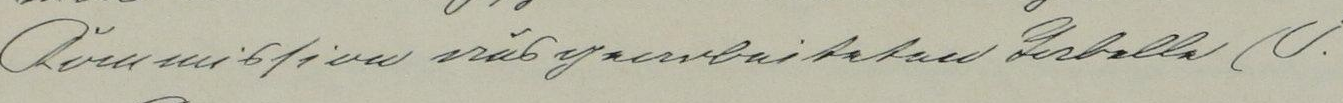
Kommission ausgearbeiteten Tabelle (T.
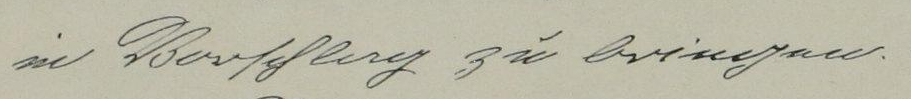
in Vorschlag zu bringen.
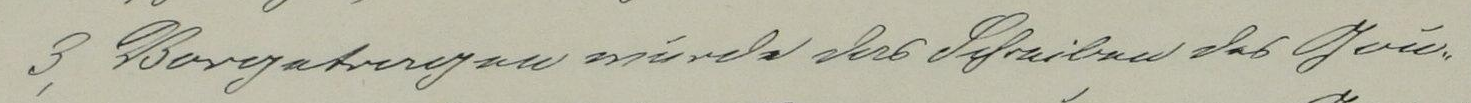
3. Vorgetragen wurde das Schreiben des Gou-
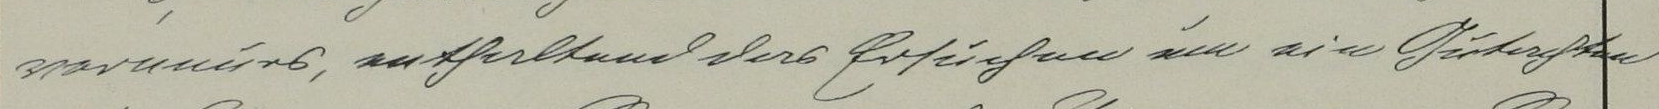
verneurs, enthaltend das Ersuchen um ein Gutachten
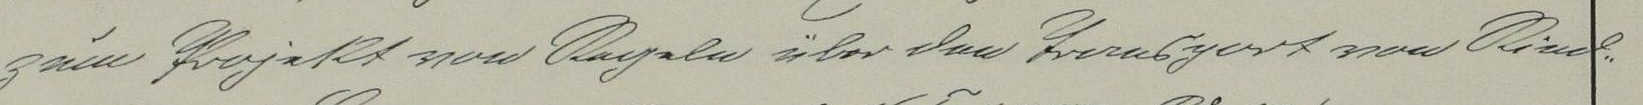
zum Projekt von Regeln über den Transport von Rind-
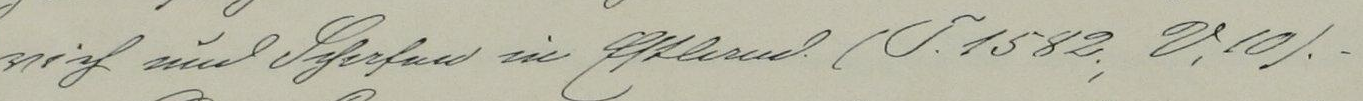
vieh und Schafen in Estland (T.1582; V.10).
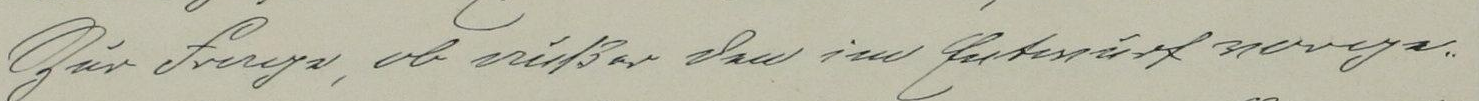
Zur Frage, ob außer den im Entwurf vorge-
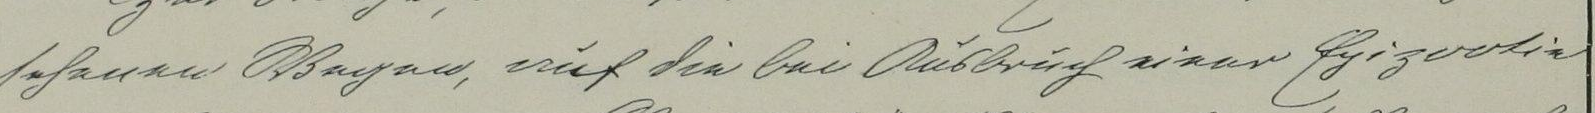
sehenen Wegen, auf die bei Ausbruch einer Epizootie
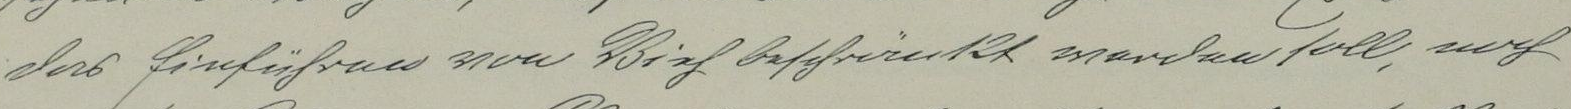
das Einführen von Vieh beschränkt werden soll, noch
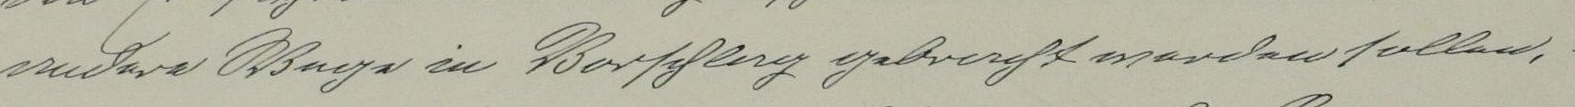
andere Wege in Vorschlag gebracht werden sollen,
